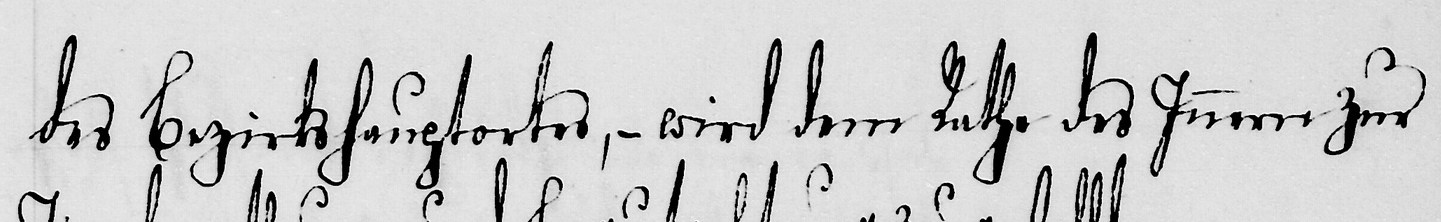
des Bezirkshauptortes, – wird dem Rathe des Innern zur
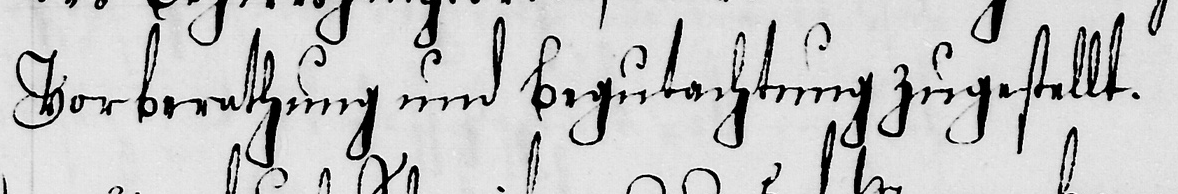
Vorberathung und Begutachtung zugestellt.
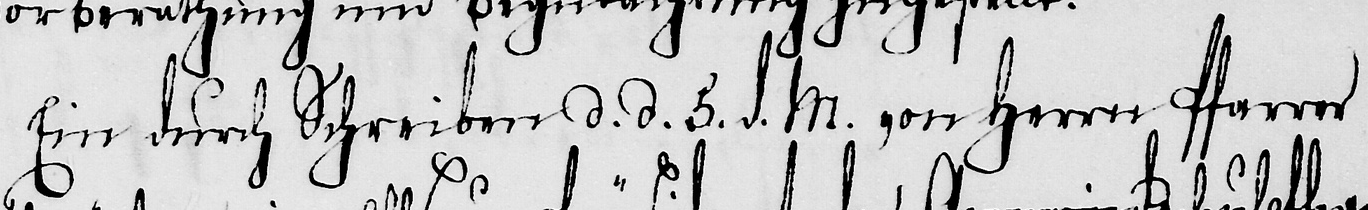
Ein durch Schreiben d. d. 5. d. M. von Herrn Pfarrer
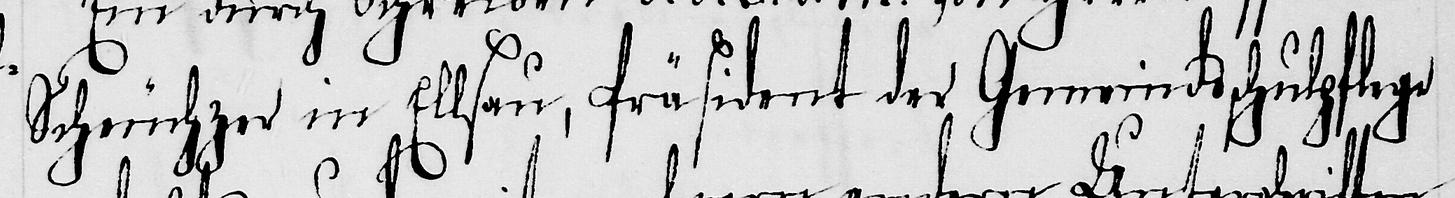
Scheuchzer in Ellsau, Präsident der Gemeindsschulpflege
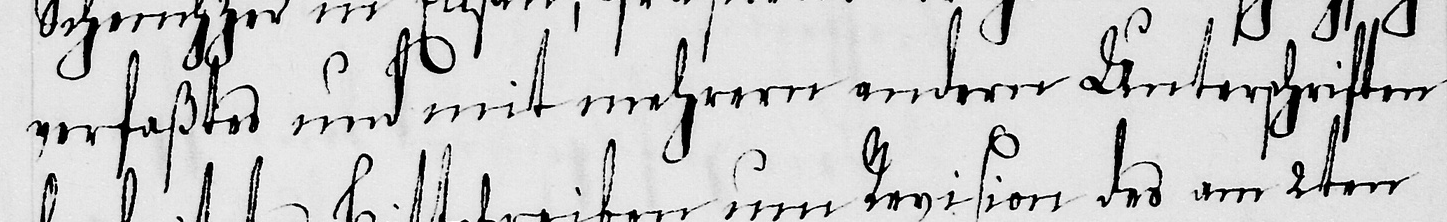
verfaßtes und mit mehrern andern Unterschriften
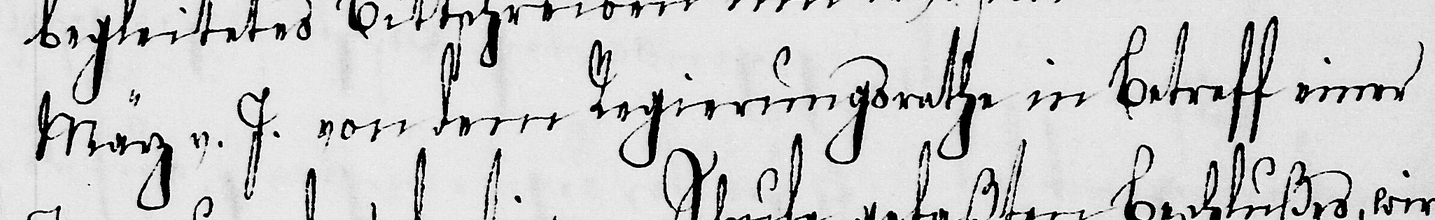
May v. J. von dem Regierungsrathe in Betreff einer
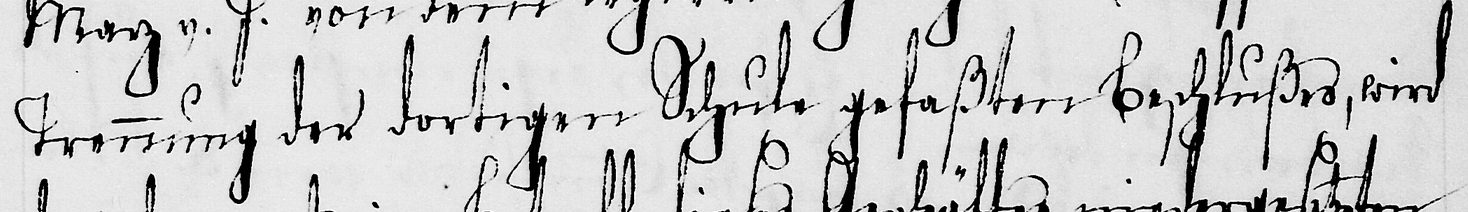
Trennung der dortigen Schule gefaßten Beschlußes, wird
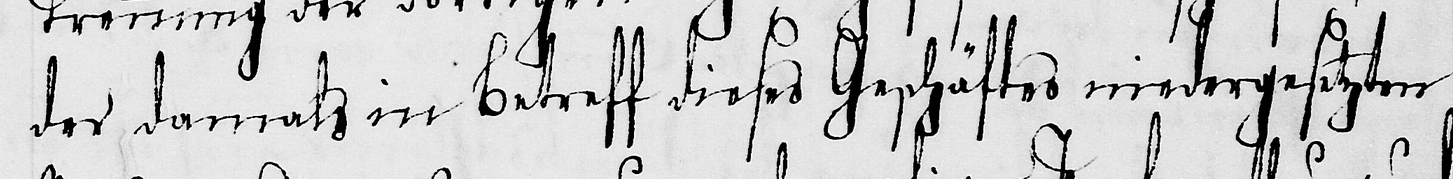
der damals in Betreff dieses Geschäftes niedergesetzten
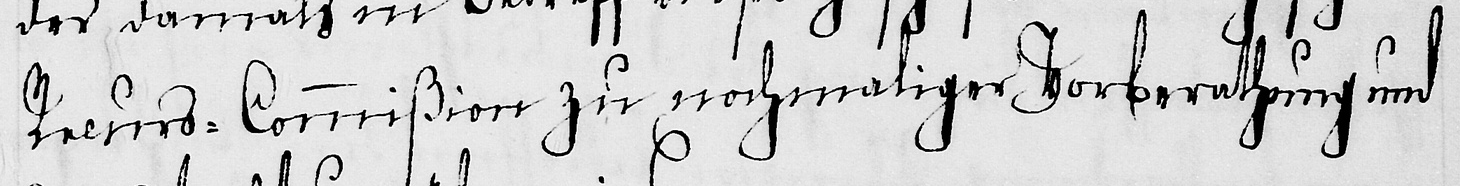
Recurs-Commißion zu nochmaliger Vorberathung und
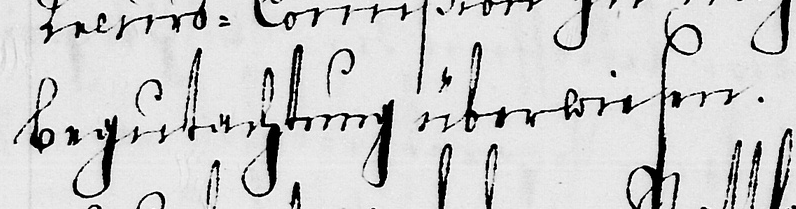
Begutachtung überwiesen.
